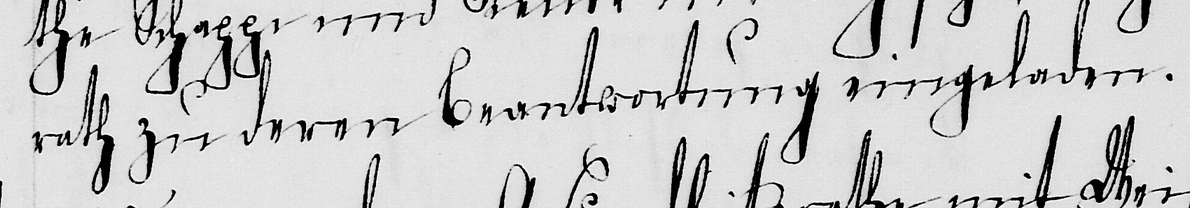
rath zu deren Beantwortung eingeladen.
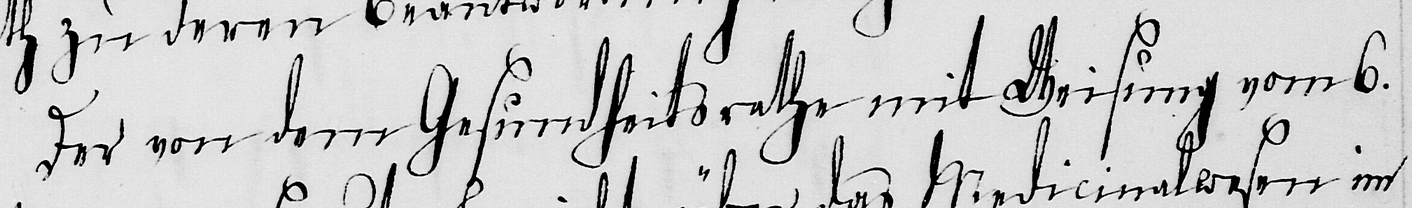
Der von dem Gesundheitsrathe mit Weisung vom 6.
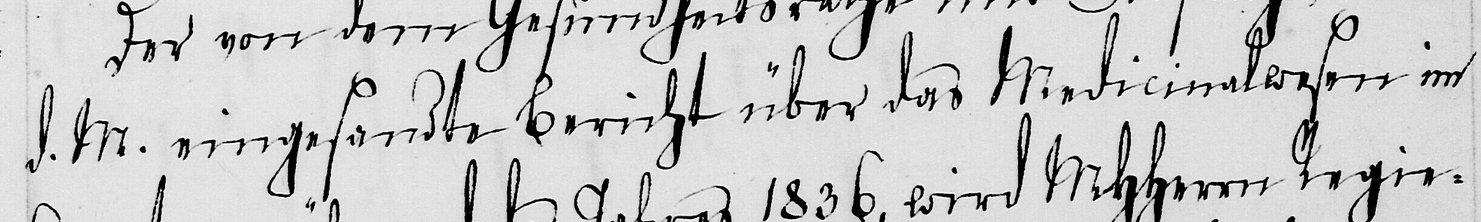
d. M. eingesandte Bericht über das Medicinalwesen im
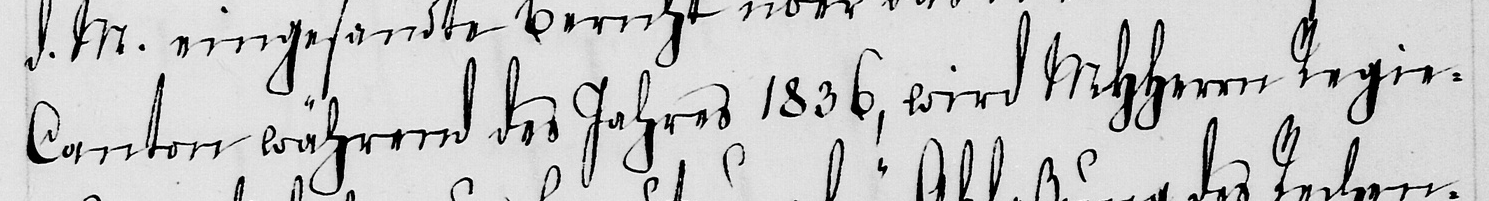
Canton während des Jahres 1836, wird MHHerrn Regie¬
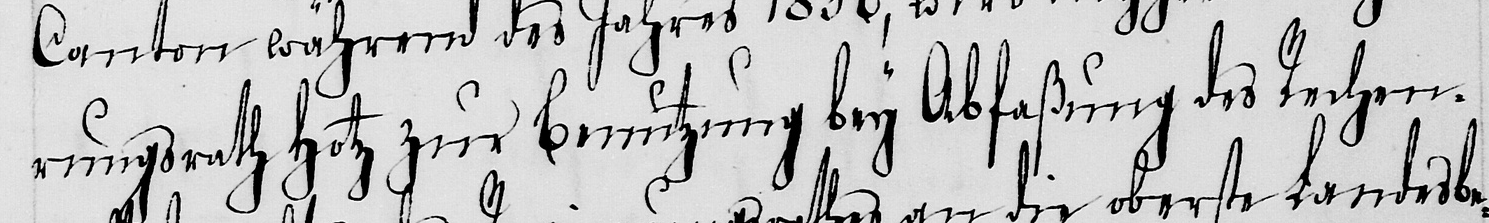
rungsrath Hotz zur Benutzung bey Abfaßung des Rechen¬
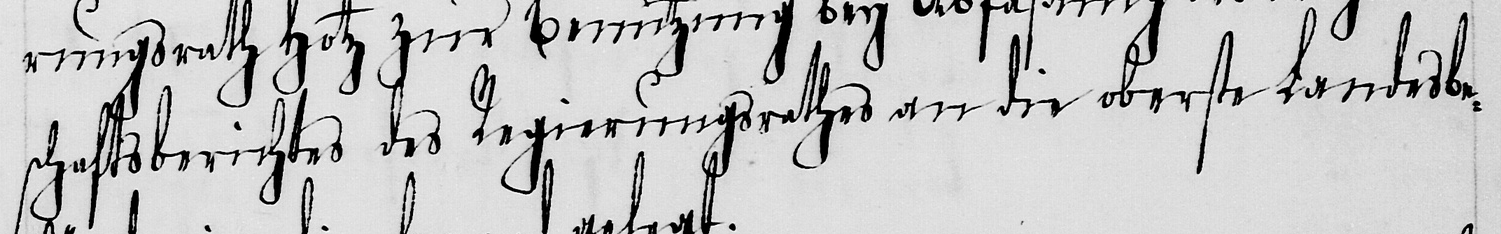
schaftsberichtes des Regierungsrathes an die oberste Landesbe¬
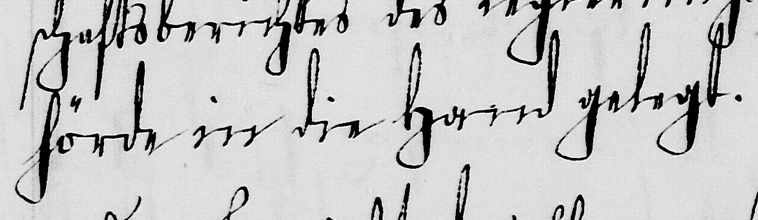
hörde in die Hand gelegt.
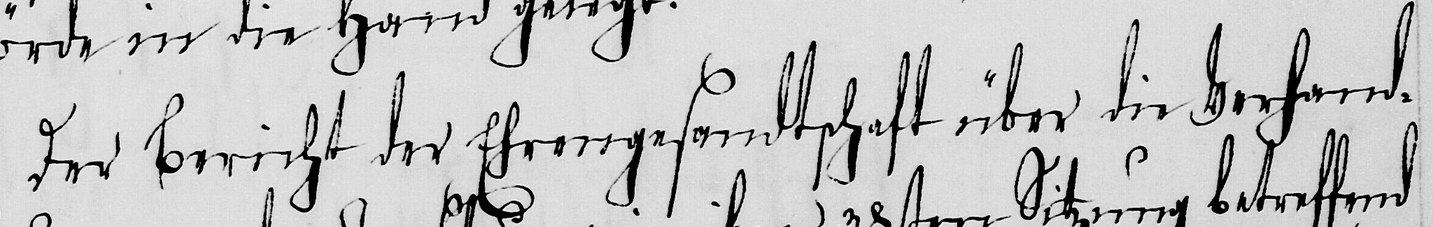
Der Bericht der Ehrengesandtschaft über die Verhand¬
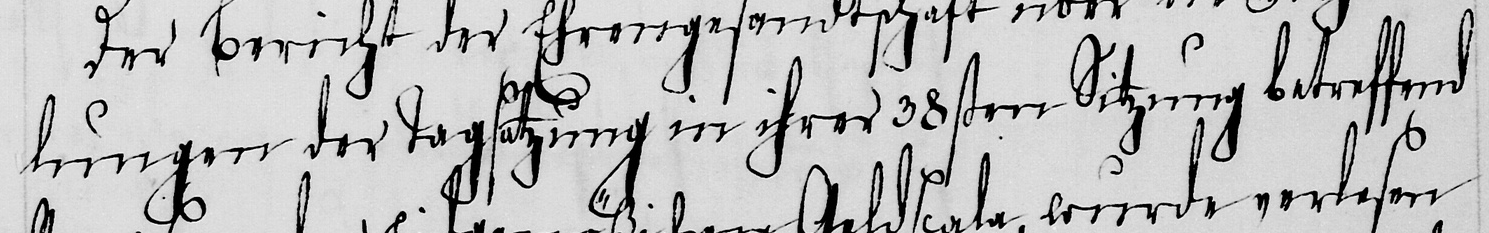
lungen der Tagsatzung in ihrer 38sten Sitzung betreffe¬
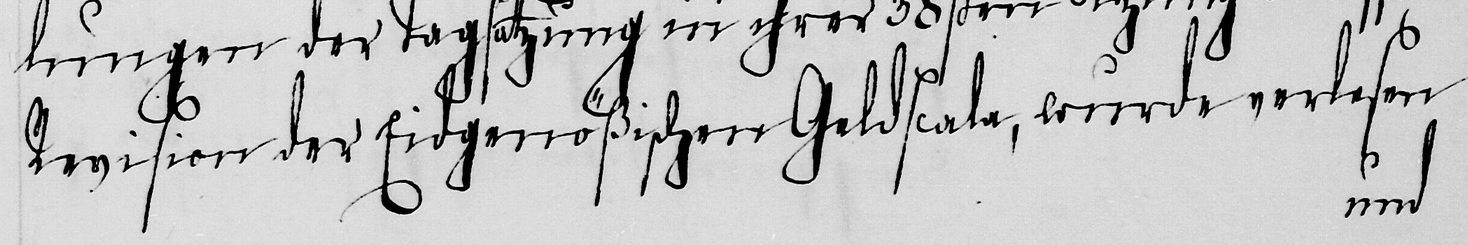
Revision der Eidgenößischen Geldscala, wurde verlesen
